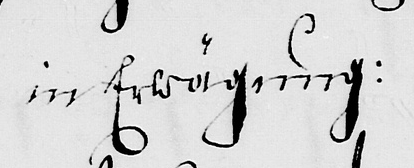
in Erwägung:
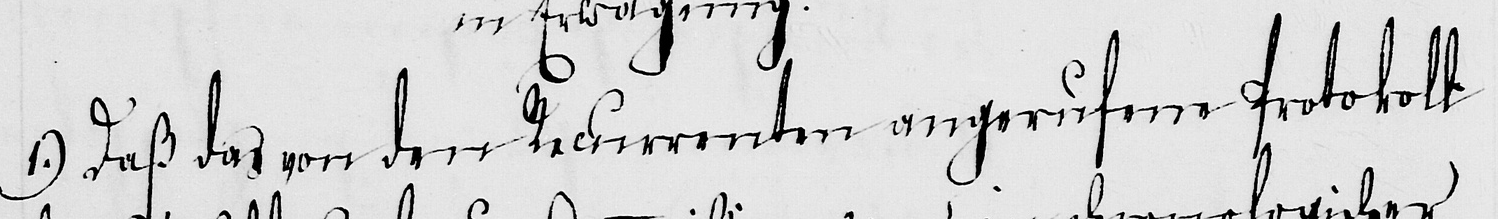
1.) Daß das von den Recurrenten angerufene Protokoll
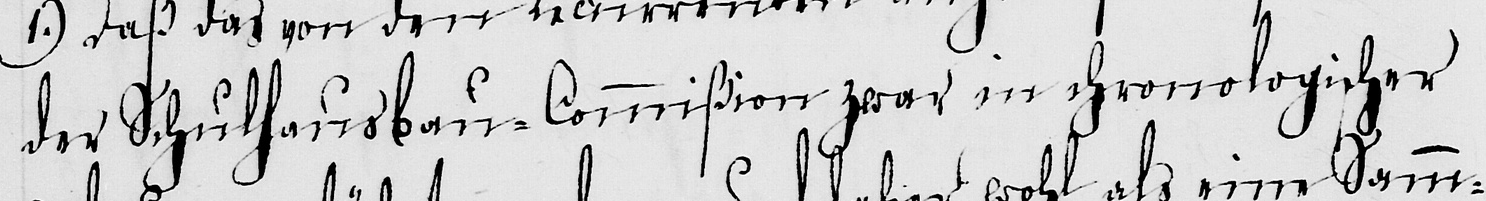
der Schulhausbau-Commißion zwar in chronologischer
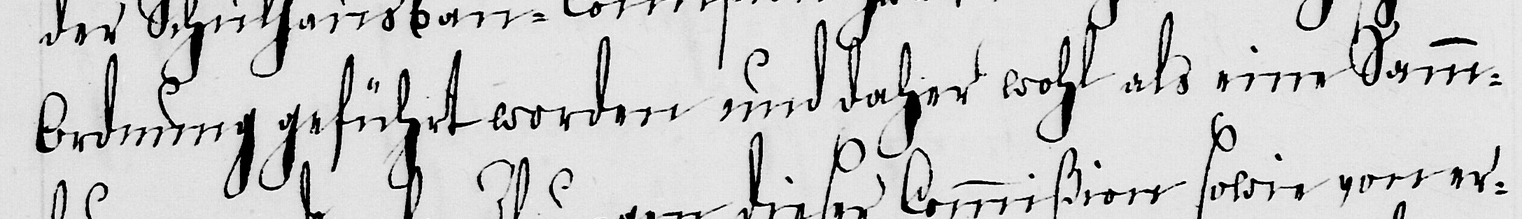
Ordnung geführt worden und daher wohl als eine Samm¬
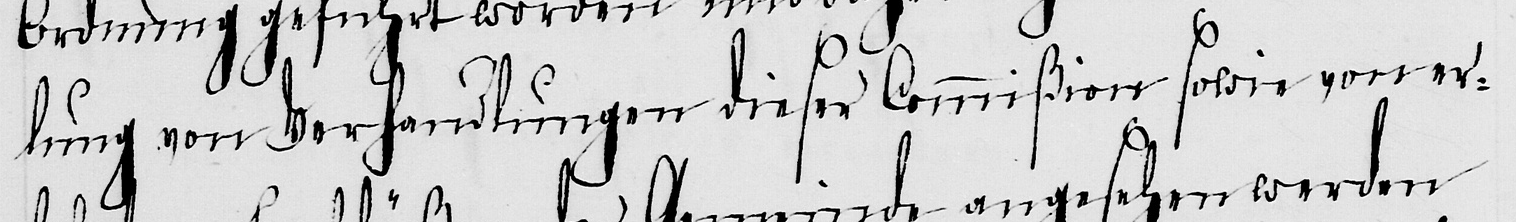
lung von Verhandlungen dieser Commißion sowie von er¬
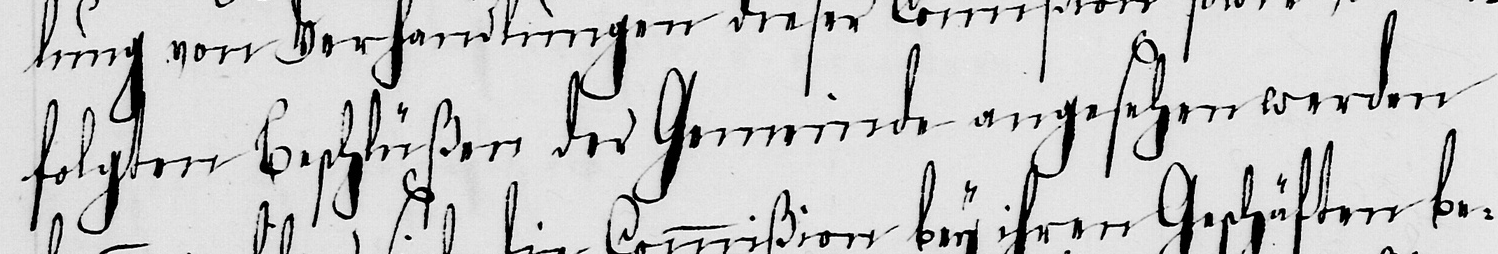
folgten Beschlüßen der Gemeinde angesehen werden
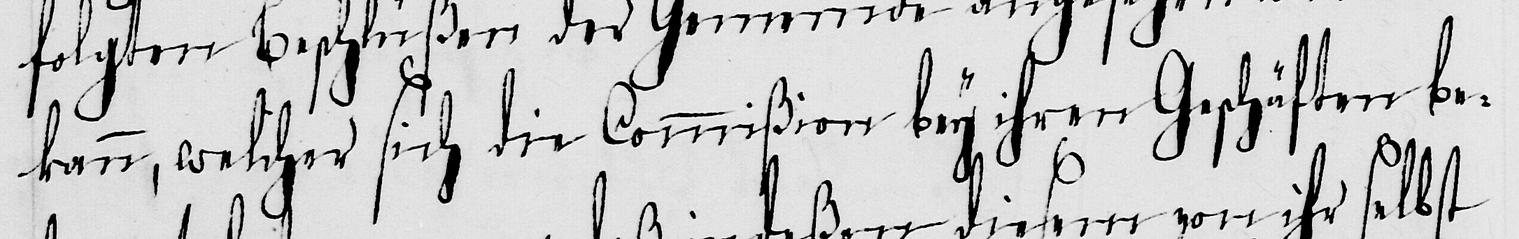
kann, welcher sich die Commißion bey ihren Geschäften be¬
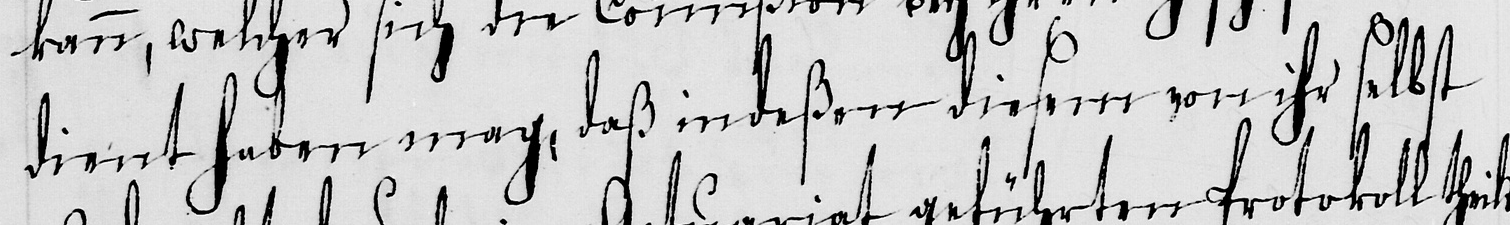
dient haben mag, daß indeßen diesem von ihr selbst
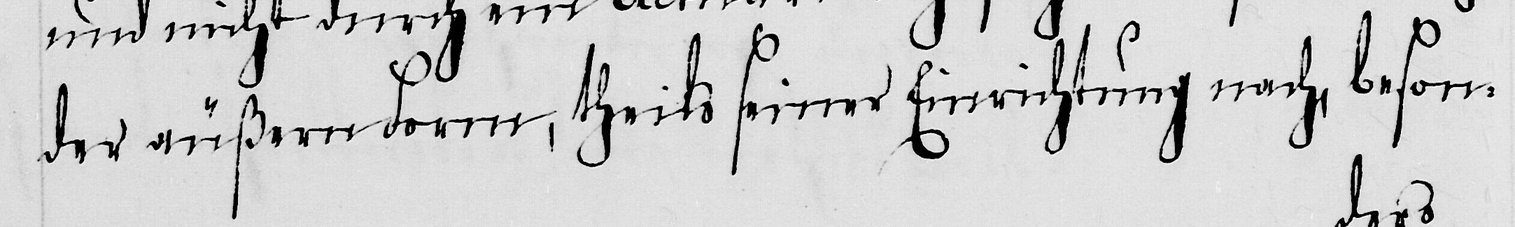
der äußern Form, theils seiner Einrichtung nach, beson-
